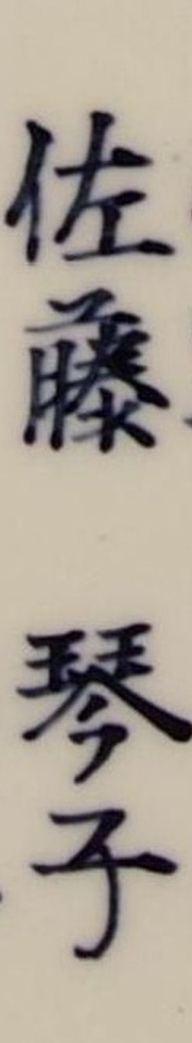佐藤琴子
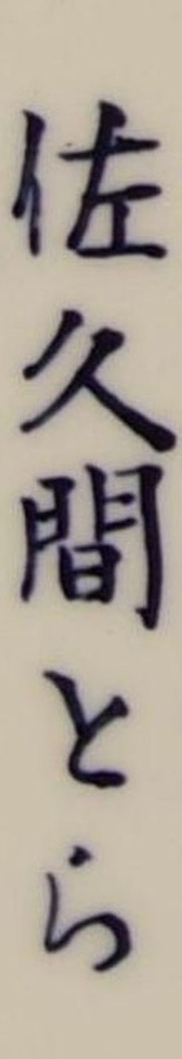佐久間とら
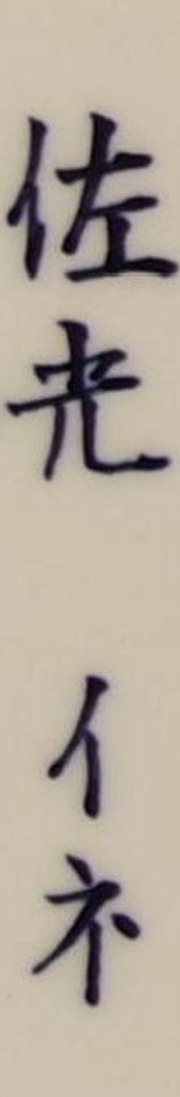佐光イネ
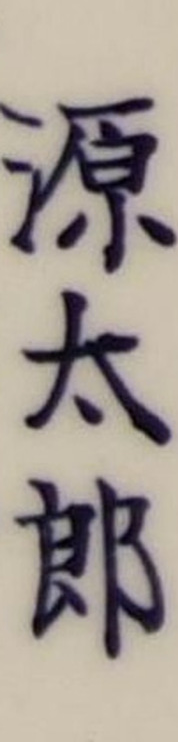源太郎
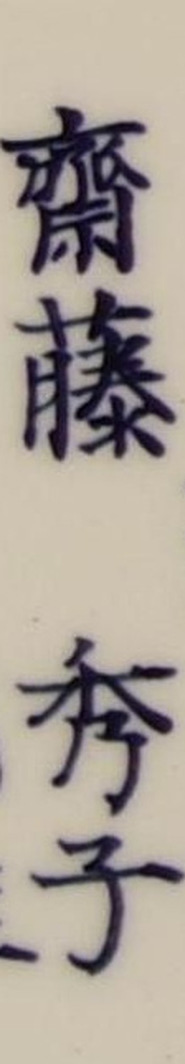斎藤秀子

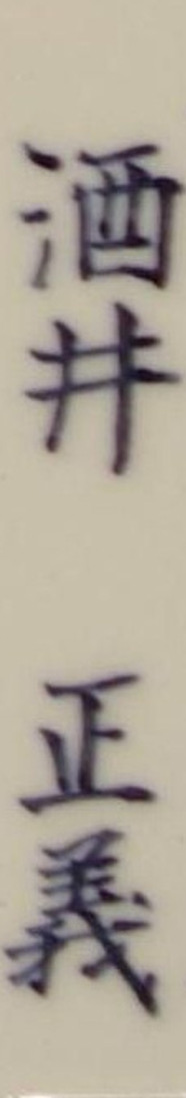酒井正義
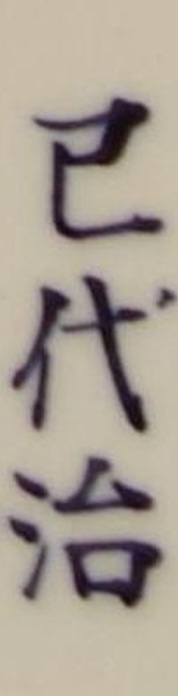巳代治
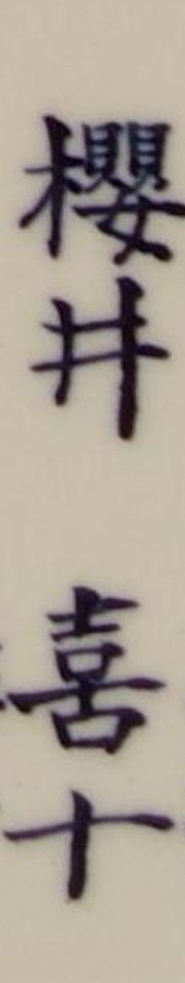桜井喜十
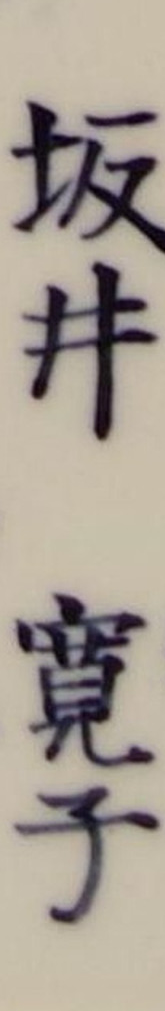坂井寛子
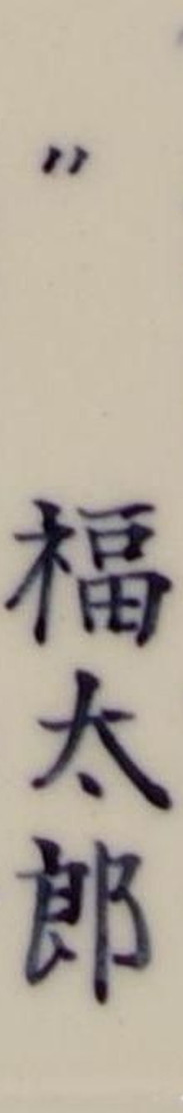福太郎
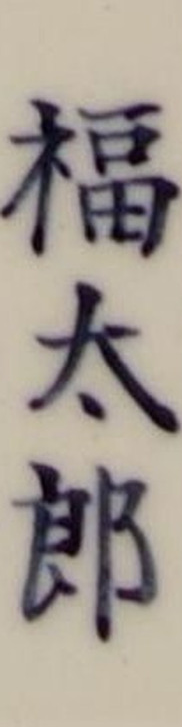福太郎
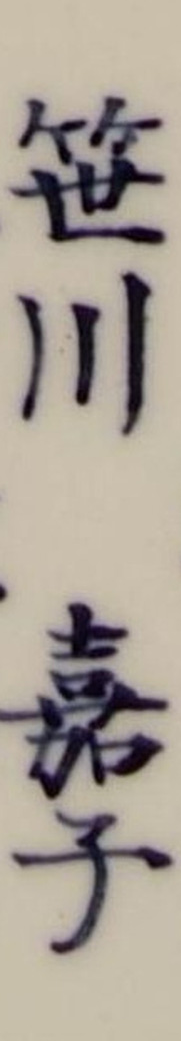笹川嘉子
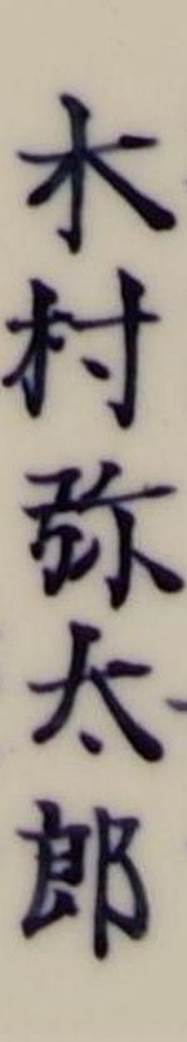木村弥太郎
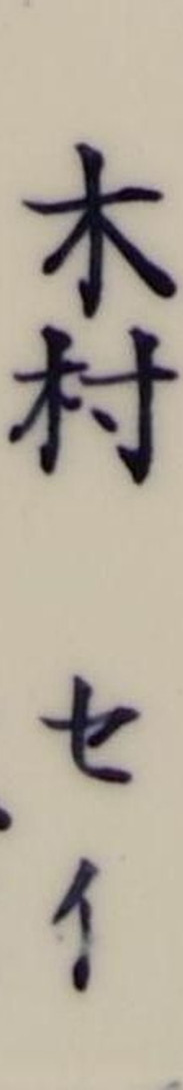木村セイ
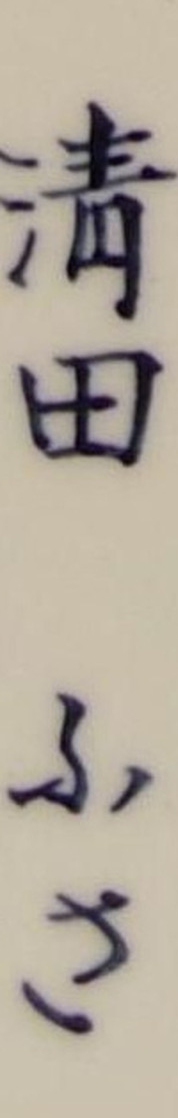清田ふさ
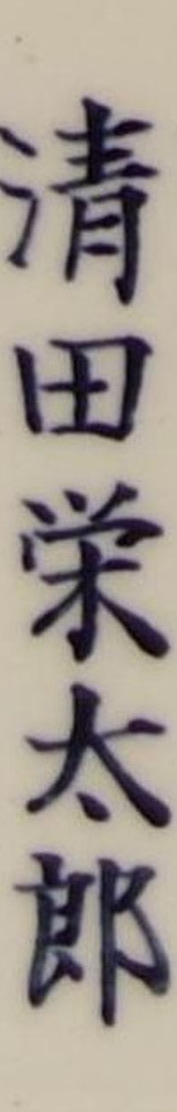清田栄太郎
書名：M~S
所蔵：高野山金剛峯寺
